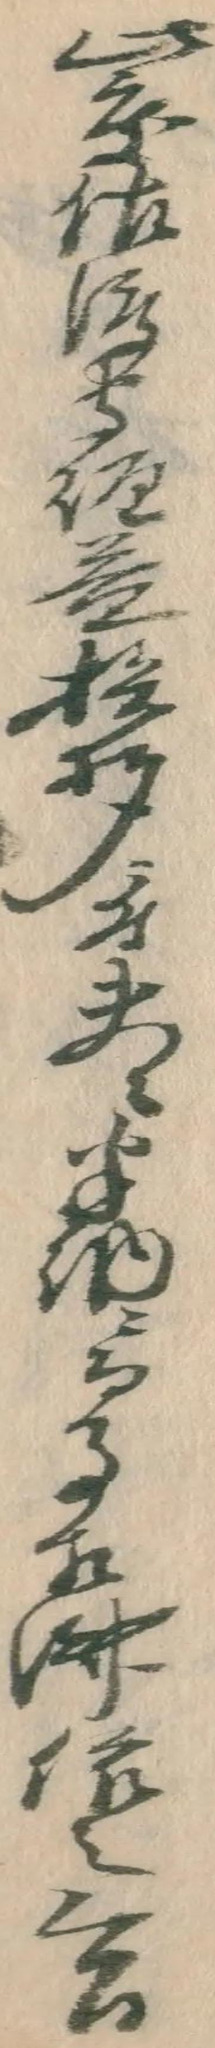此度佐渡守経益挨拶ニ付夫々半納ニ而事相済依之今日
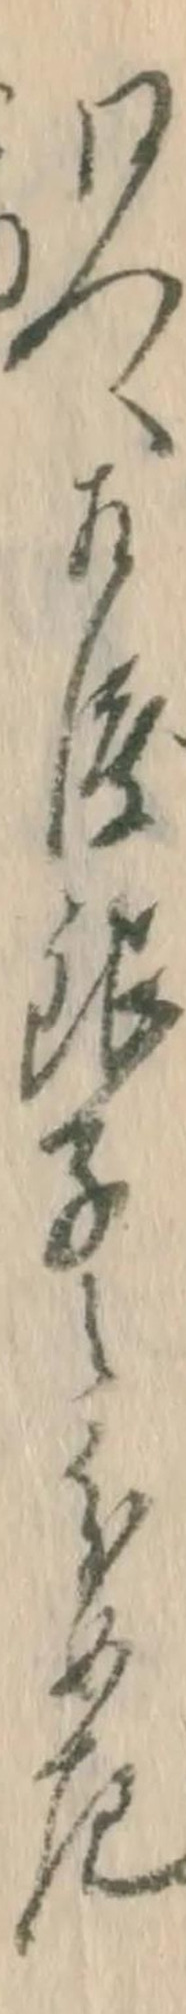同人へ相渡銀子之分如左
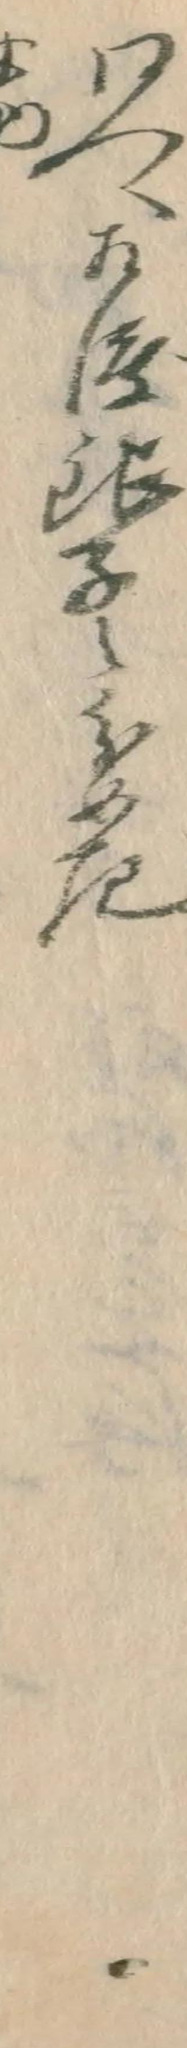同人へ相渡銀子之分如左

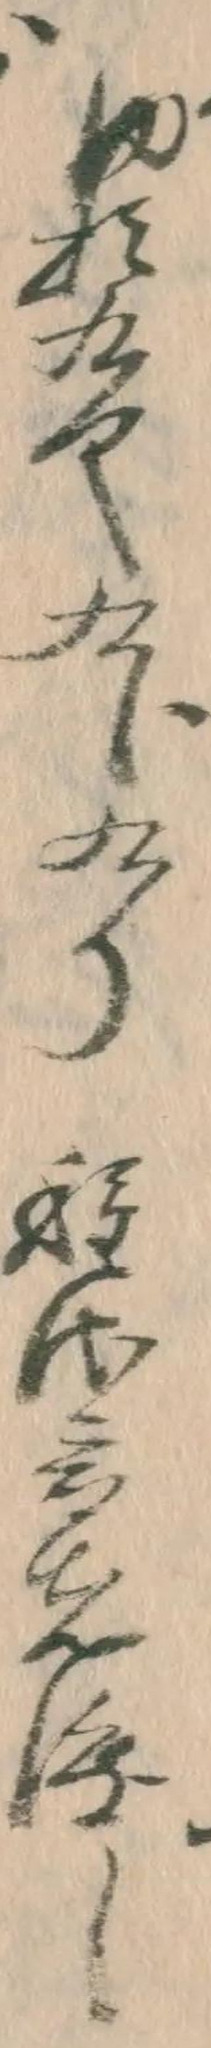内拾九匁九分九厘種代二而先渡し
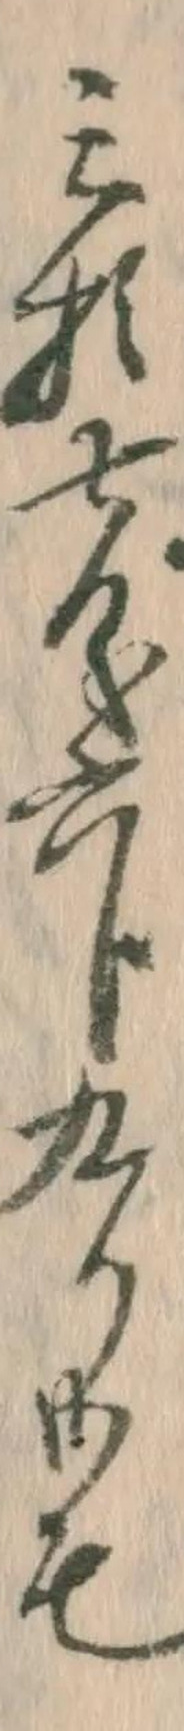三拾七匁六分九厘弐毛
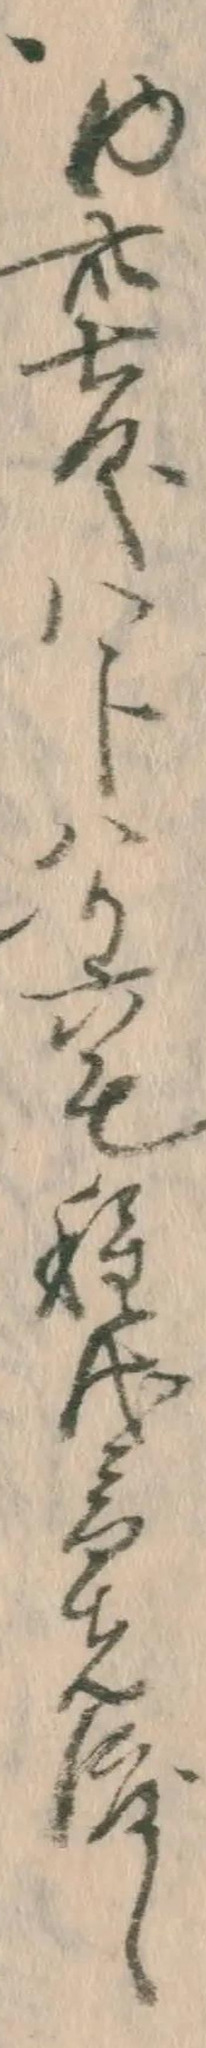内卅七匁八分八り六厘種代ニ而先渡し
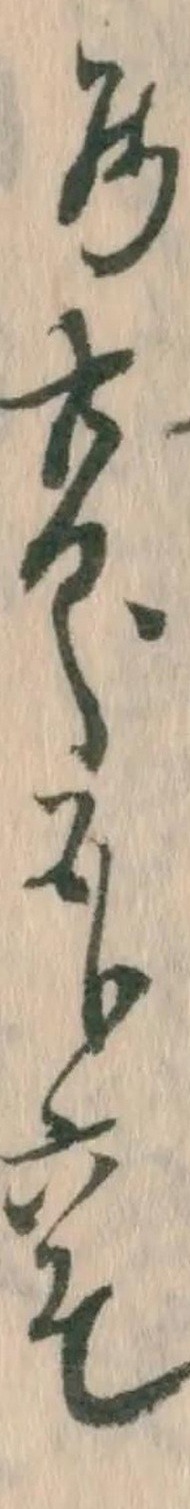残廿匁五分六厘
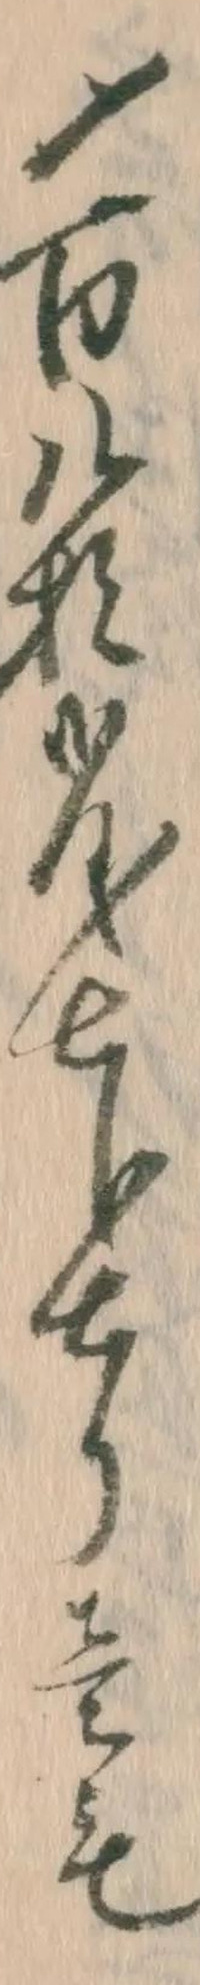〆百八拾弐匁七分七厘壱毛
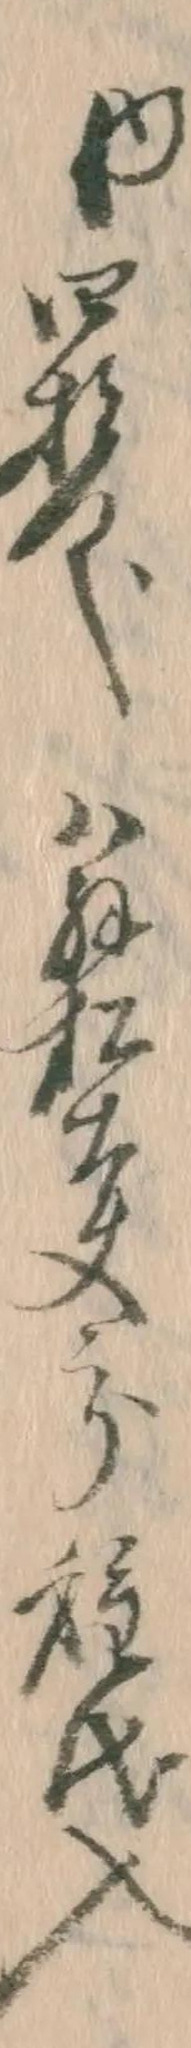内四拾匁翁松大夫分種代入
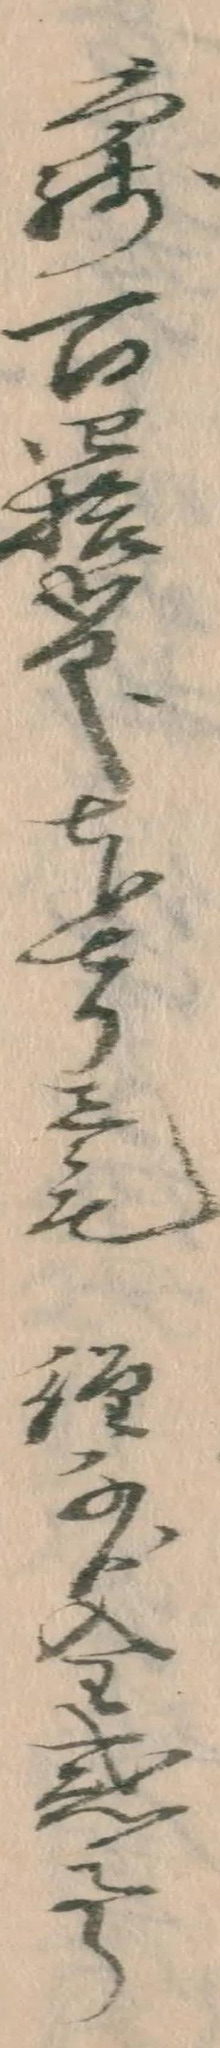尚残百四拾弐匁七分七厘壱毛経千分金惑之了
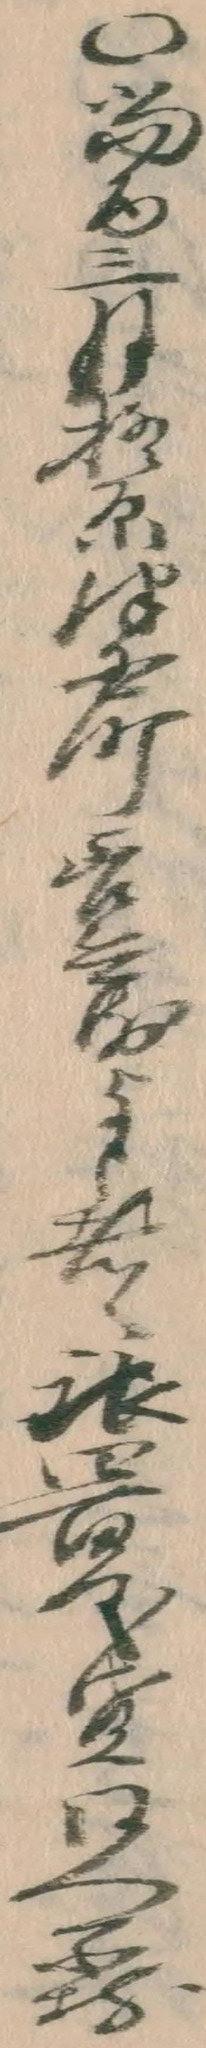○當酉三月柊原津国町善兵衛と申者へ銀四百匁貸同人所持
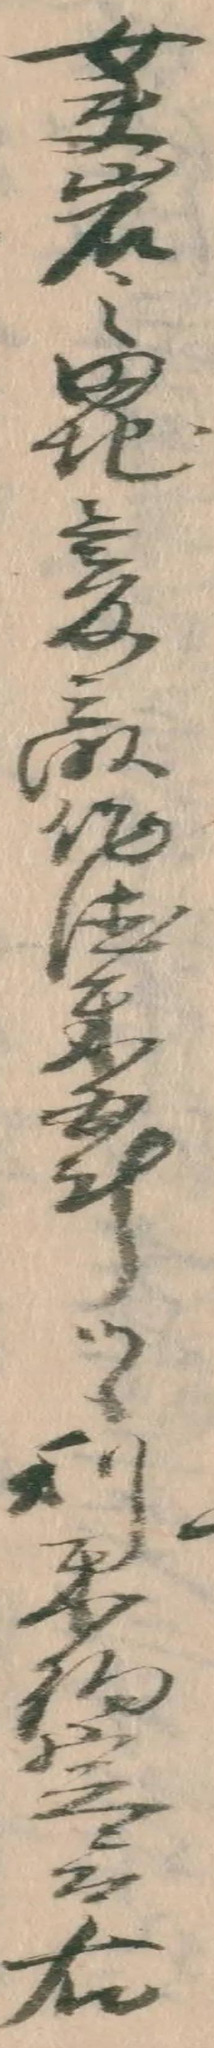女夫岩之田地壱反三畝作徳米五斗ツヽ利米釣定ニ而右
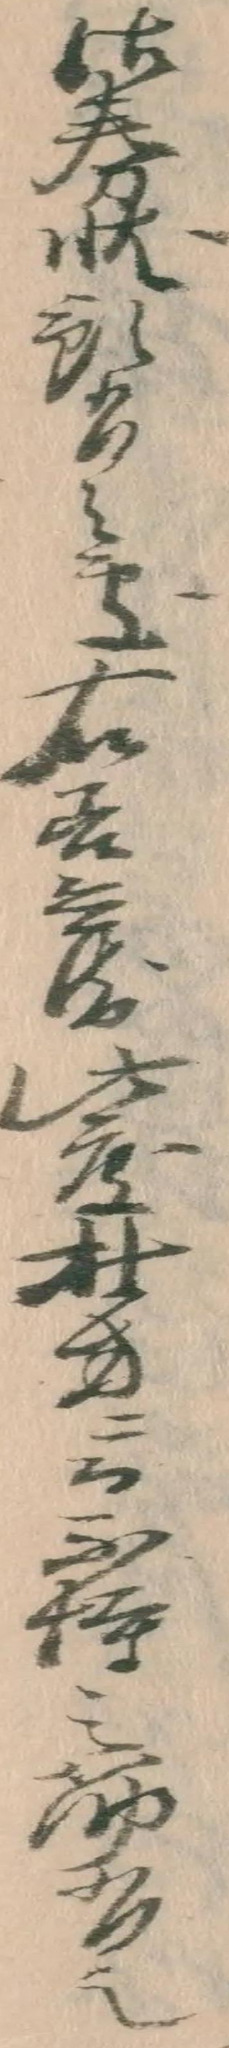沽券状預有之處右善兵衛此度村方ニ而不埒之筋有之
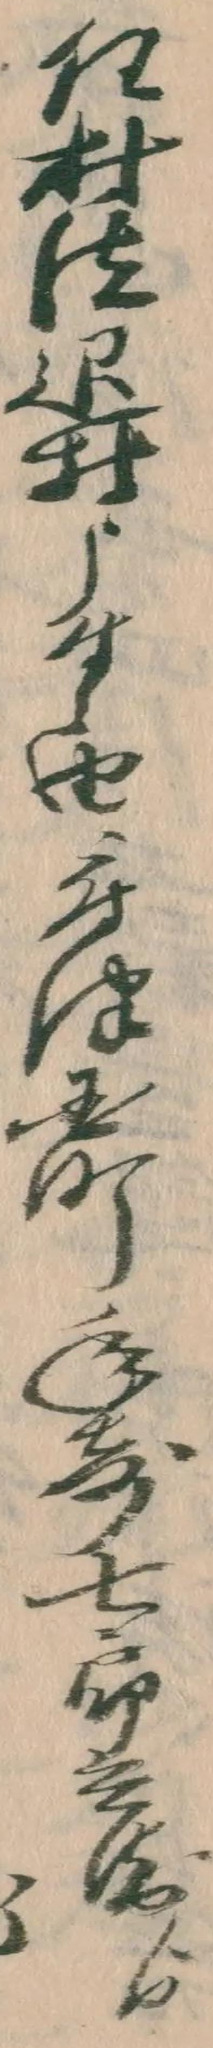任村法退村申付候由に付津国町年寄七郎兵衛ゟ
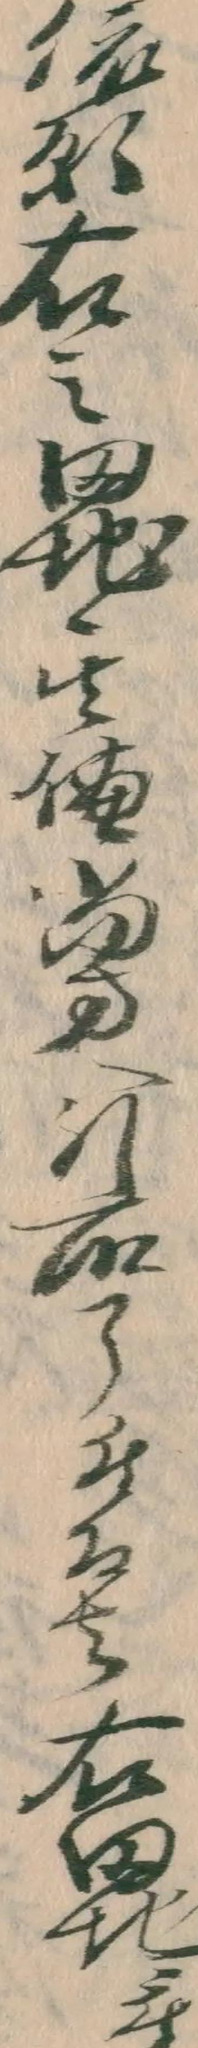依願右之田地其侭當方へ引取了付而其右田地ニ付
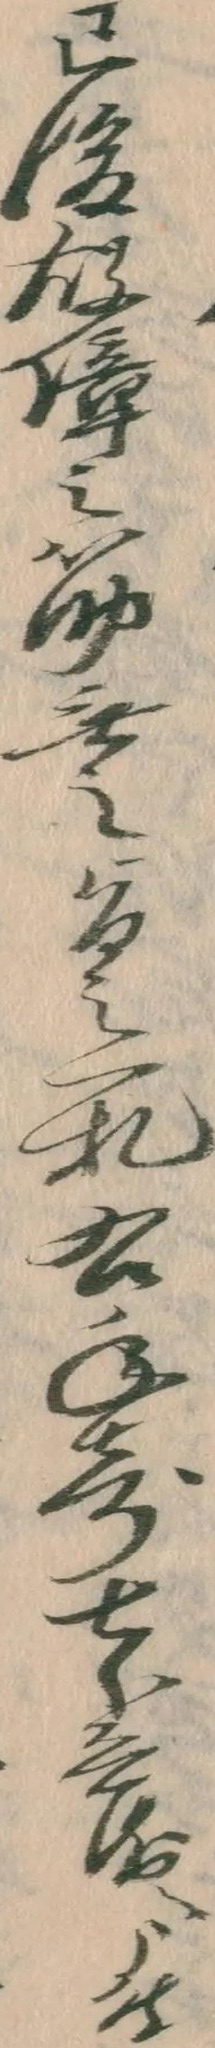已後故障之筋無之旨之一札右年寄七郎兵衛へ申付
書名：賀茂社記録. 第67冊
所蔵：国立国会図書館 National Diet Library, JAPAN
